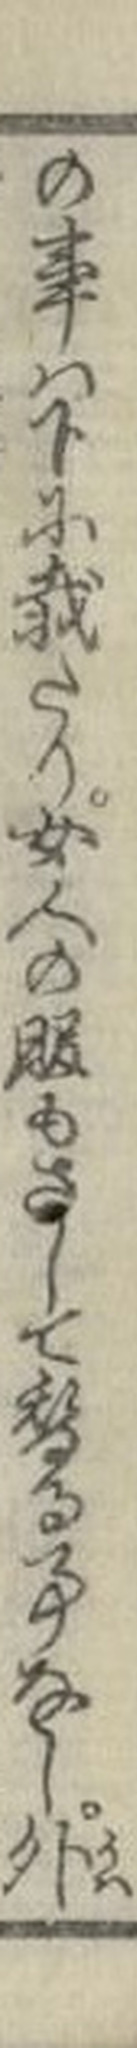の事は下に載たり。女人の服もさして替る事なし。外
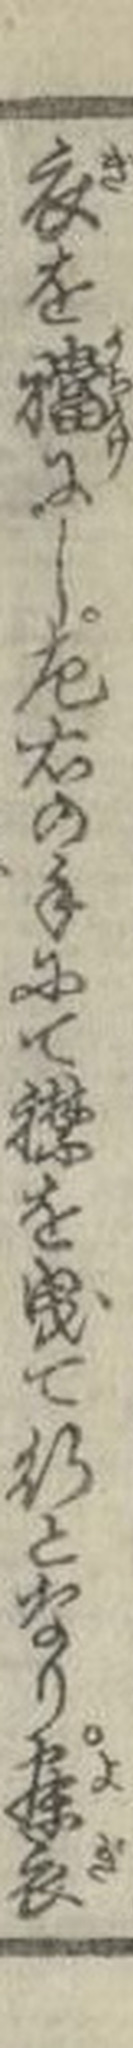衣を襠にし。左右の手にて襟を曳て行となり。寝衣
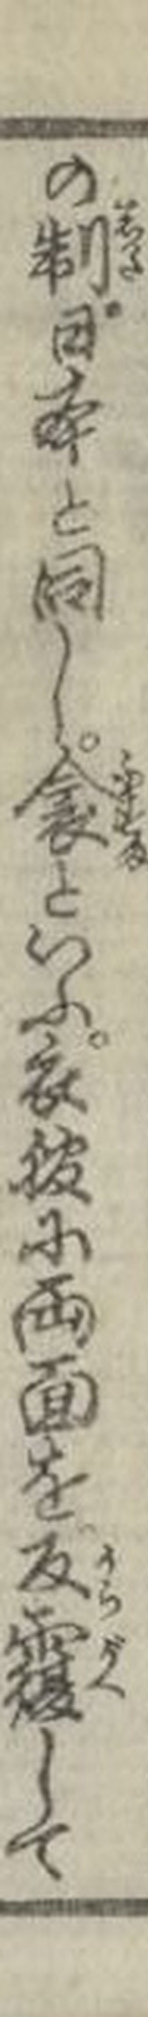の制。日本と同じ。衾といふ。衣服に両面を反覆して
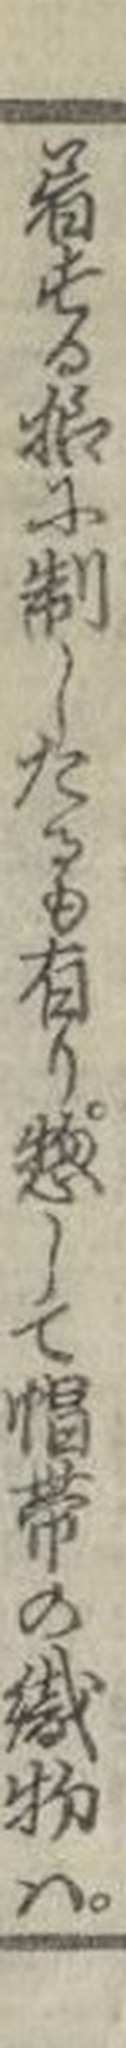着たる様に制したるも有り。惣して帽帯の織物は。
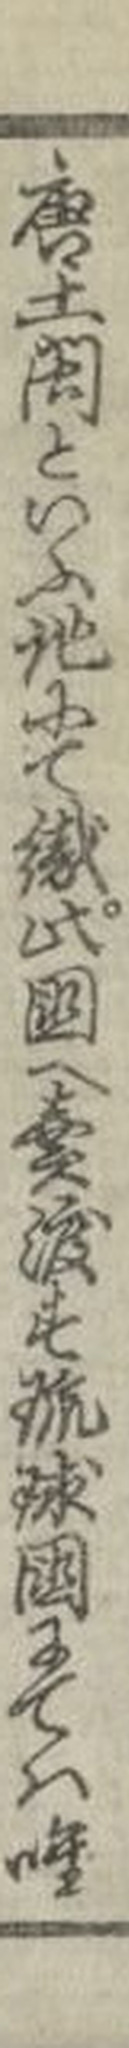唐土といふ地にて織。此国へ売渡す琉球国にては唯
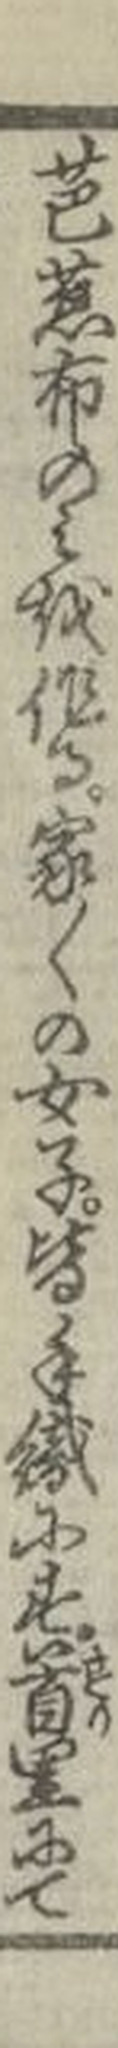芭蕉布のみを作る。家〳〵の女子。皆手織にす。首里にて
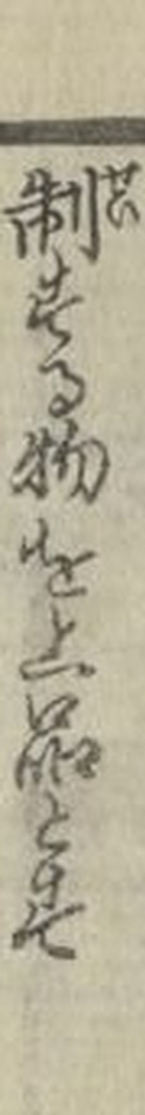制する物を上品とす
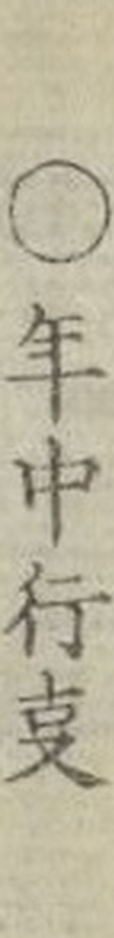○年中行事
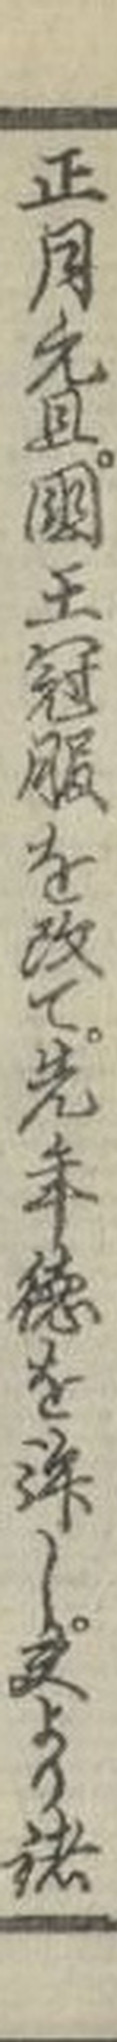正月元旦。国王冠服を改て。先年徳を許し。夫より諸
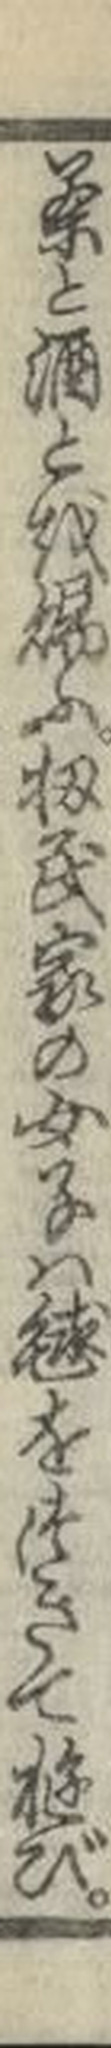茶と酒とを賜ふ。扨民家の女子は毬をつきて遊び。
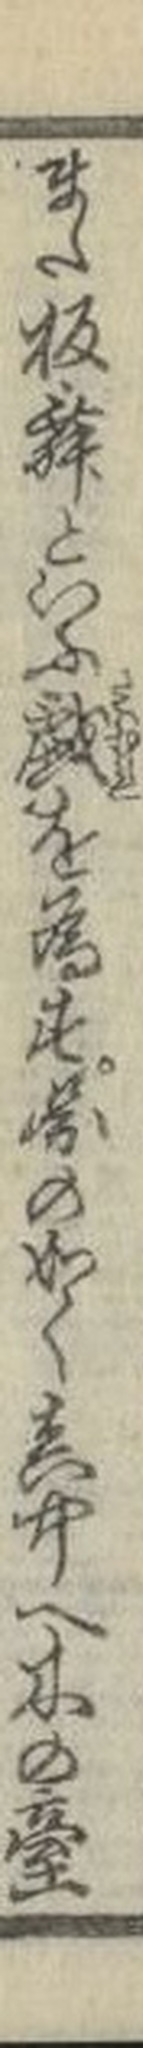また板舞といふ戯を為す。図の如く真中へ木の台
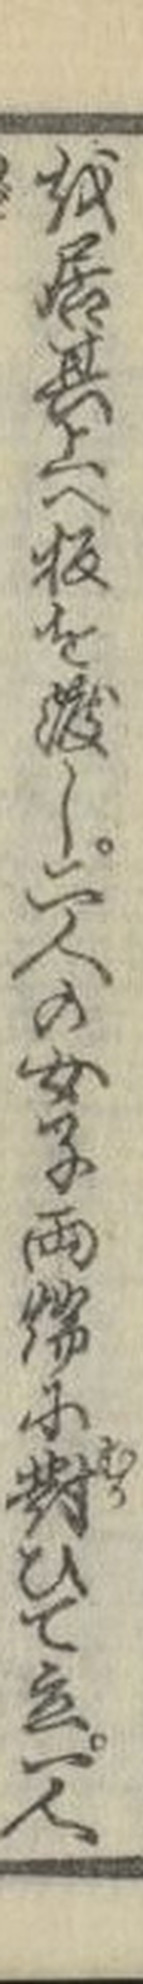を居其上へ板を渡し。二人の女子両端に対ひて立。一人
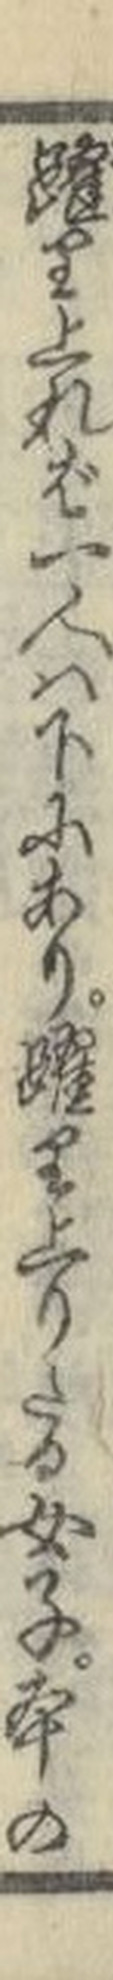躍り上れば一人は下にあり。躍り上りたる女子。本の
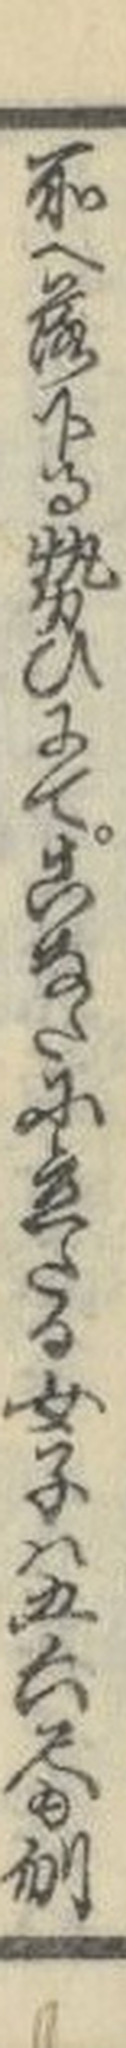所へ落下る勢ひにて。こなたに立たる女子は五六尺も刎
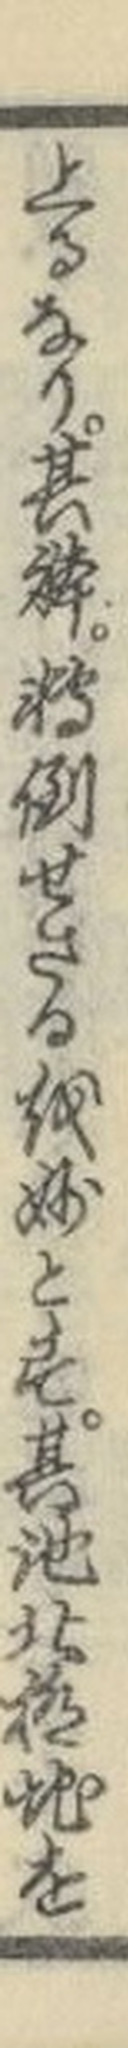上るなり。其舞。転倒せさるを妙とす。其池北極地を
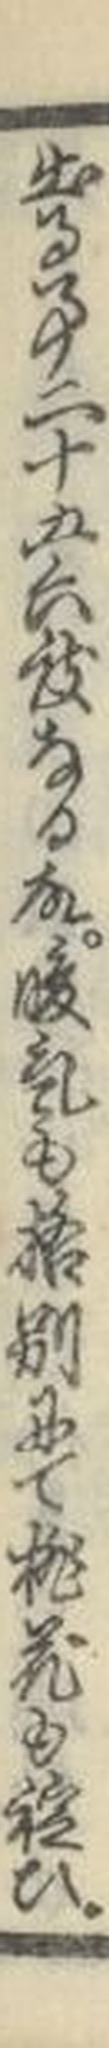出る事二十五六度なる故。暖気も格別にて桃花も䘺ひ。
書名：琉球解語
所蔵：University of the Ryukyus Library
